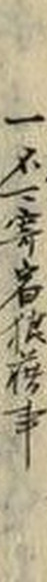一不可寄宿狼藉事
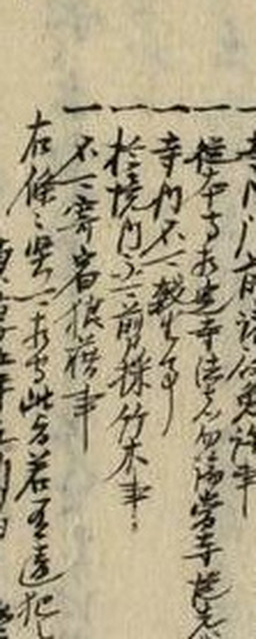一於境内不可剪採竹木事
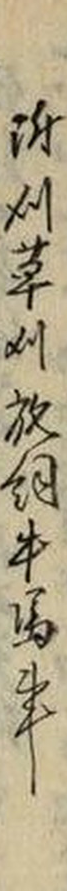附刈草刈放飼牛馬事
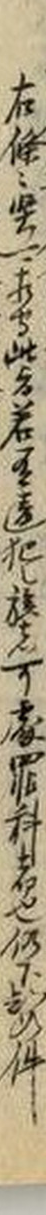右条々堅可相守此旨若有違犯之族者可処罪科者也仍下知如件
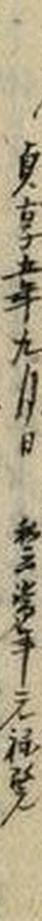貞享五年九月日私言当年元禄改元
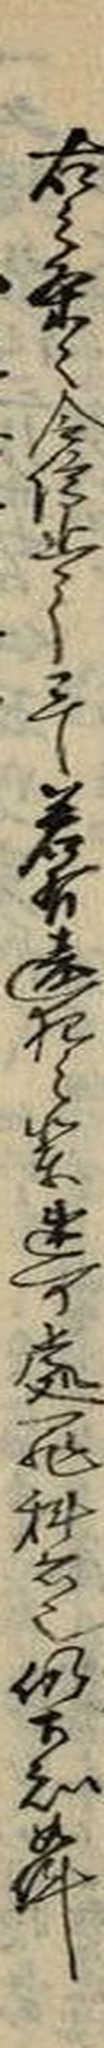右之条々令停止之若有違犯之輩速可処罪科者也仍下知如件
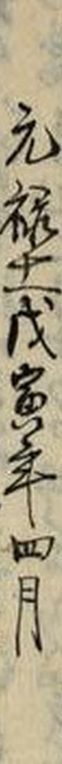元禄十一戊寅年四月
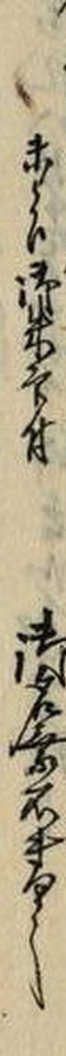未被下御朱印付御名乗不書之
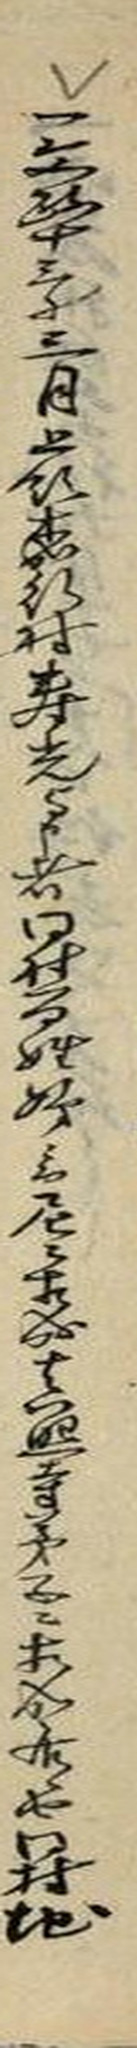一文政十三寅三月上領森行村寿光与申者同村百姓姉ニ而尼ニ相成真照寺弟子ニ相成居候由同村地
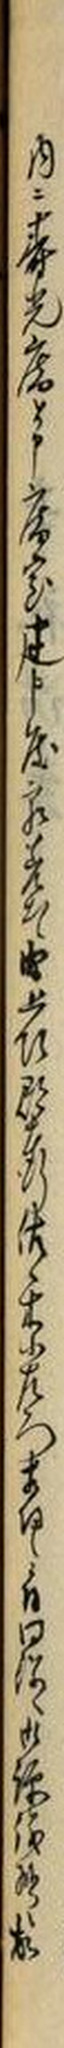内ニ寿光庵と申庵室建申度願差出候由上領郡奉行佐々木小左衛門相伺候ニ付同役へ御評議掛候故
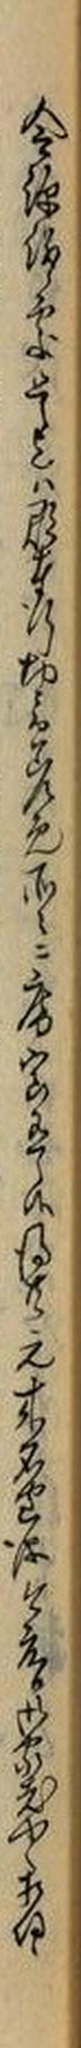令評議候処是迄ハ郡奉行切ニ而差免所々ニ庵室有之候得共元来不宜儀今度ハ御家老中へ相伺候
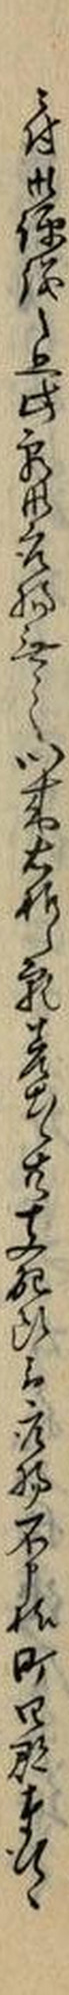ニ付御評議之上此願御取揚無之以来右様之願差出候共支配頭ニ而取揚不申様町四郡奉行へ
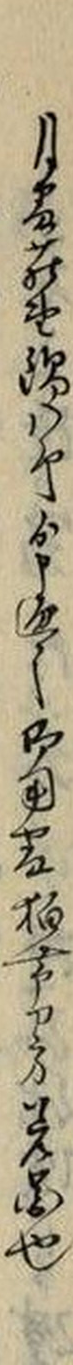月番荻野鍋八郎ゟ申通之御用番狛帯刀方差図也
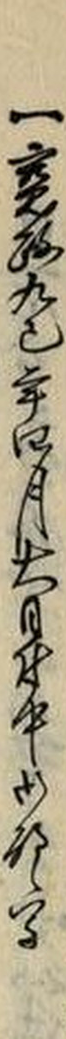一寛政九巳年四月大目付中御触之写
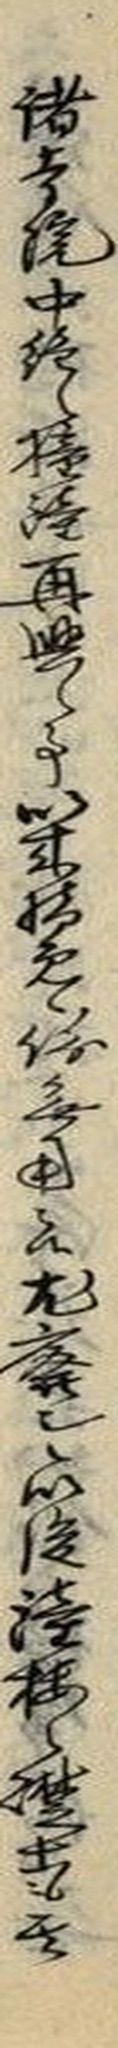諸寺院中絶之撞鐘再興之事以来指免候儀無用ニ候尤廃シ候以後鐘楼之礎等も其
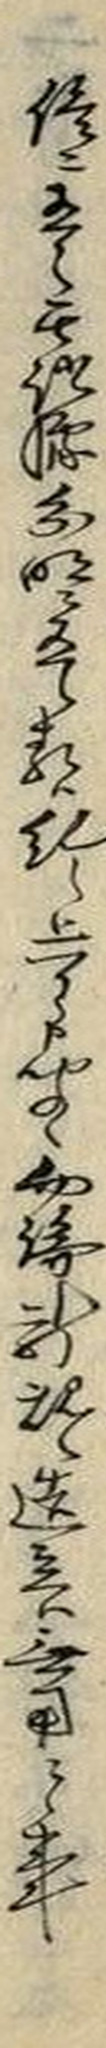儘ニ有之其証拠分明ニ有之類ハ糺之上可被申聞候勿論新規之造立ハ無用ニ候事
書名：御国他国諸事之部
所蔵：福井県文書館 Fukui Prefectural Archives
